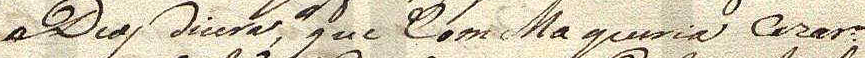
a Deos dicera, que Com ella queria cazar:
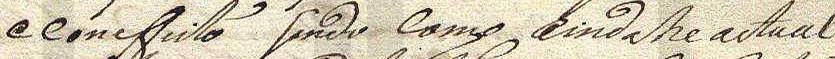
e con effeito sendo Como ainda he actual
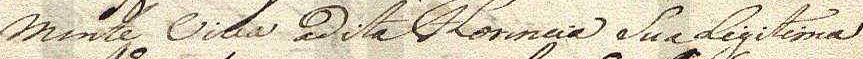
mente uiua a dita Florencia sua Legitima
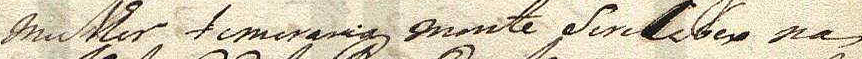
mulher temerariamente Se reCebeo na
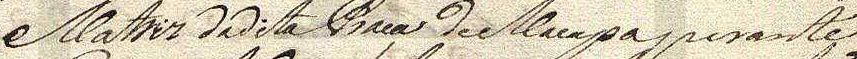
Matriz da dita Praça de Macapa perante
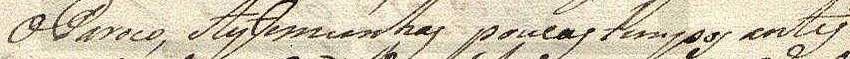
O Paroco, As testemunhas poucos tempos antes
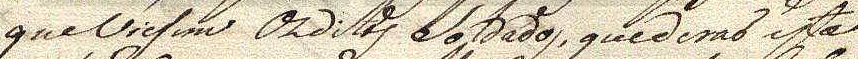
que viesem oz dittos Soldados, que deraõ esta
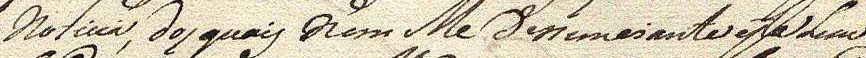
noticia, dos quais nem elle denunciante esta Lem
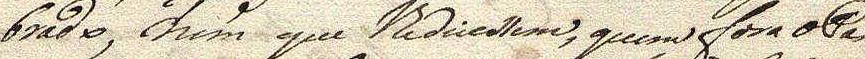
brado, nem que lhe dicessem, quem fora o Pa
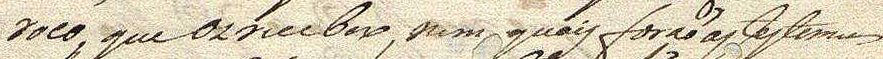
roco, que oz recebeo, nem quais foraõ as testemu
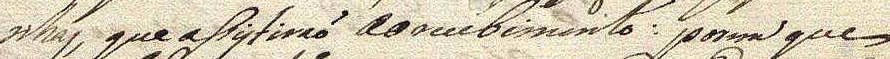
nhas, que assistiraõ ao recebimento: porem que
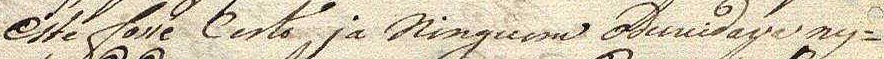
este fosse Certo ja ninguem o duvidava nes
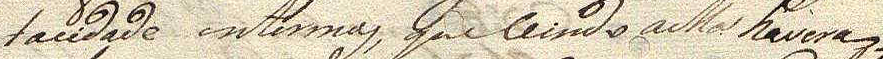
ta cidade en termos, que vindo a ella havera
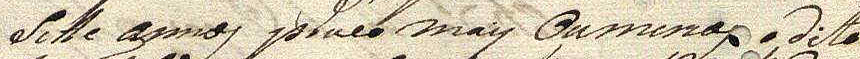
Sette annos pouco mais ou menos o dito
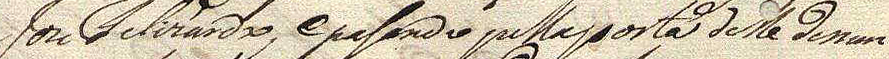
Joze Felizardo, e pasando pella porta delle denun
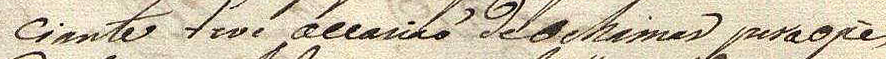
ciante teve occaziaõ de o chamar para o pé
